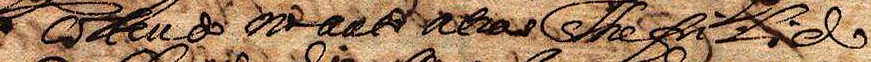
cōteudo no auto atras e lhe foi Lido
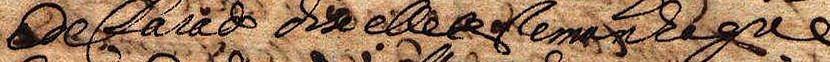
e deClarado disse elle testemunha que
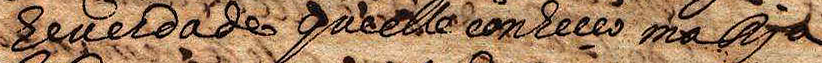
he uerdade que elle conheçeo maRja
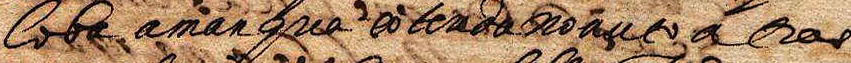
Loba a manqua coteuda no auto atras
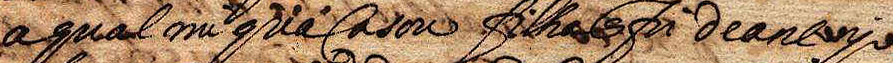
a qual nunqua Casou filha q̄ foi de antonjo
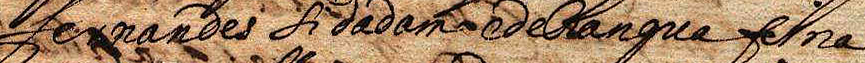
fernandes sidadam e de branqua ferna
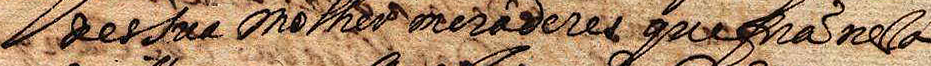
des sua molher moradores que foraõ nesta
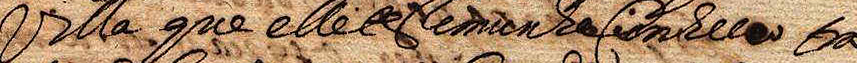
Villa que elle testemunha Conhec_o tra
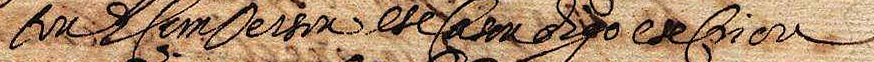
tou e ComVersou e se Casou digo e se Criou
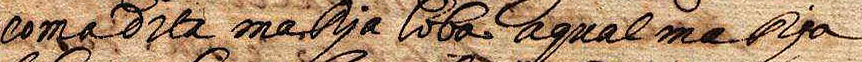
com a dita maRja loba a qual maRia
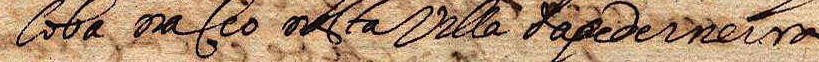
loba naCeo nesta Villa da pederneira
